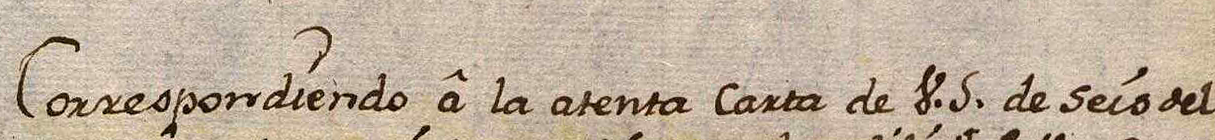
Correspondíendo â la atenta carta de V. S. de seís del
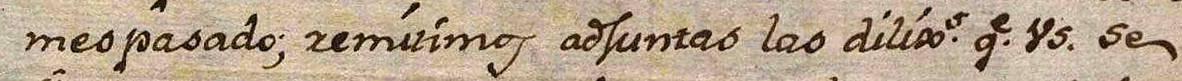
mes pasado; remitímos adjuntas las dilíx.s q.e Vs. se
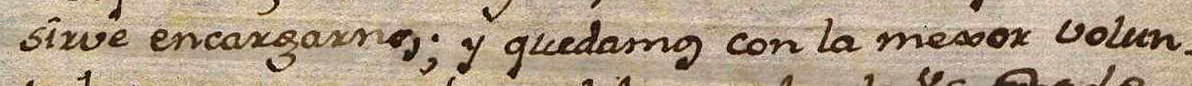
sirve encargarnos; y quedamos con la mexor volun
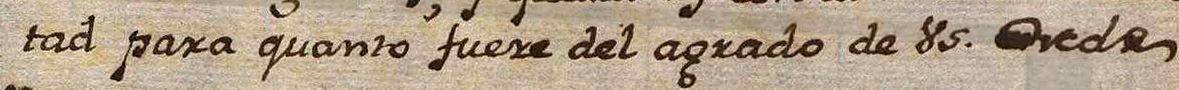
tad para quanto fuere del agrado de Vs. Orde
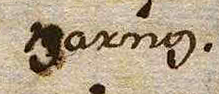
narnos.
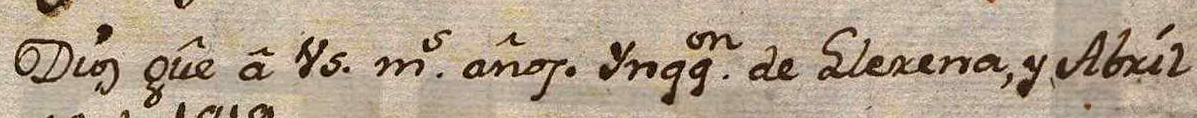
Diós gûe â Vs. m.s años. Inqq.on de Llerena, y Abríl
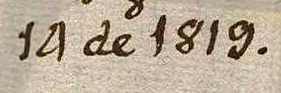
14 de 1819.
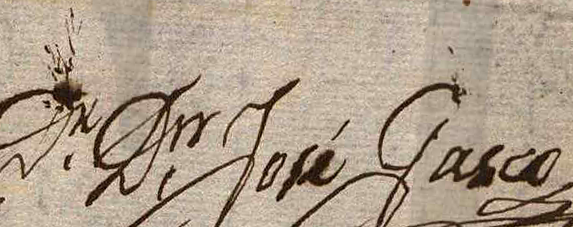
D.n D.or José Gasco
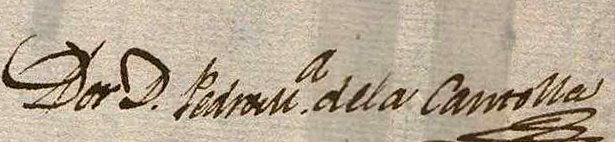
Dor D. Pedro m.a dela Cantolla
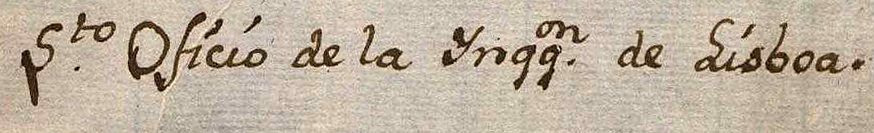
S.to Ofício de la Inqq.on de Lisboa.
